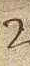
2
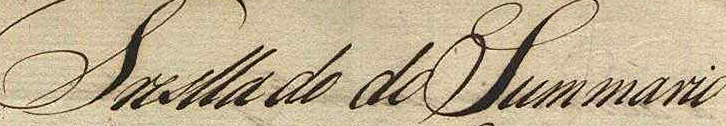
Tresllado do Summario
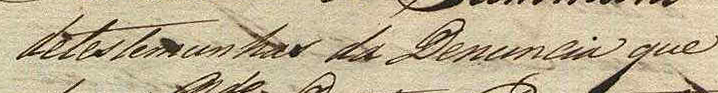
de testemunhas da Denuncia que
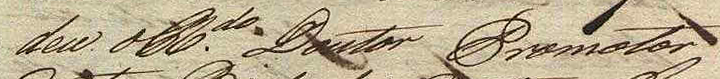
deu o R.do Doutor Promotor
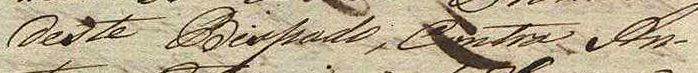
deste Bispado, Contra An
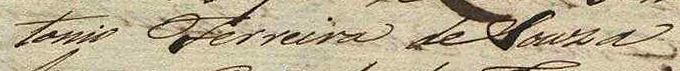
tonio Ferreira de Souza
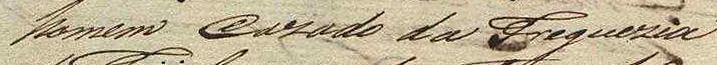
homem cazado da Freguezia
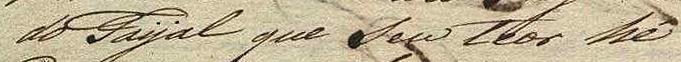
do Fayal que seu teor hé
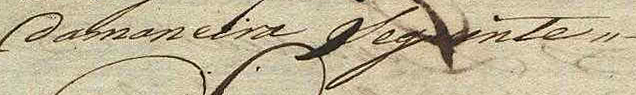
da maneira Seguinte
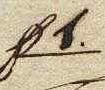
f̄1.
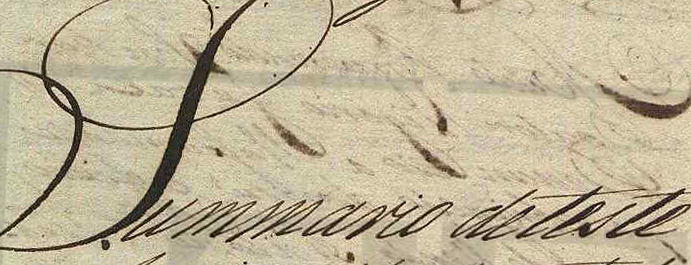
Summario de teste
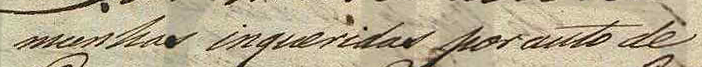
munhas inqueridas por auto de
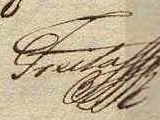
Freita
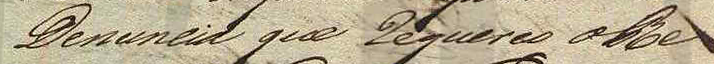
Denuncia que Requereo o Re
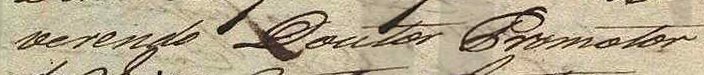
verendo Doutor Promotor
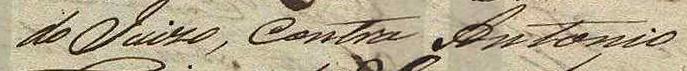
do Iuizo, contra Antonio
